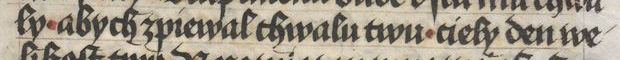ly.abych zpíewal chwalu twu.ciely den we¬
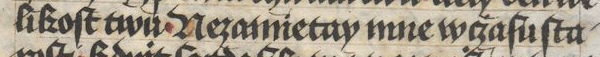likoſt twu.Nezamietay mne w cżaſu ſta¬
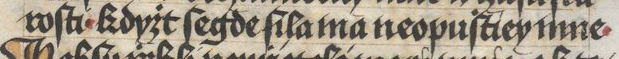roſti.kdyżt ſegde ſila ma neopuẛtiey mne.
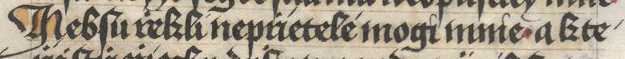Nebſu ṙekli nepṙíetelé mogi mnie.a kte¬
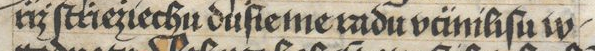ṙiż ſtṙieżiechu duẛie me radu vċiniliſu w¬
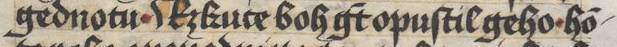gednotu.Rrkuce boh ḡt opuſtil geho.ho¬
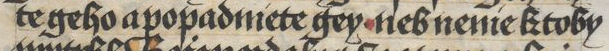te geho a popadniete gey.neb nenie ktoby
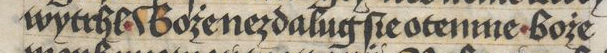wytrhl.Boże nezdalugſie otemne.boże
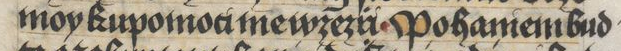moy kupomoci me wzezṙi.Pohaniem bud¬
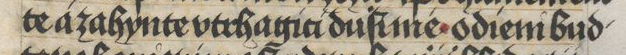te a zahynte vtrhagící duẛi mé.odieni bud¬
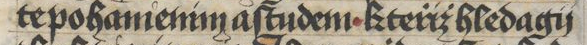te pohanienim a ſtudem.kteṙíż hledagij
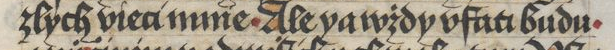zlych vieci mnie.Ale ya wżdy vfati budu.
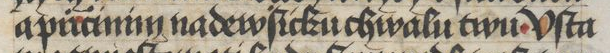a pṙícinim nadewẛicku chwalu twú.Vſta¬
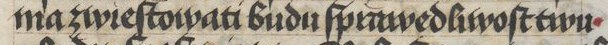ma zwieſtowati budu ſprawedliwoſt twu.
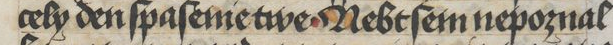cely den ſpaſenie twe.Nebt ſem nepoznal
